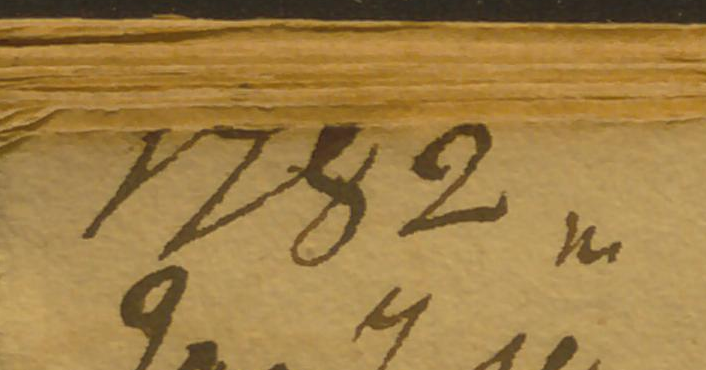1782
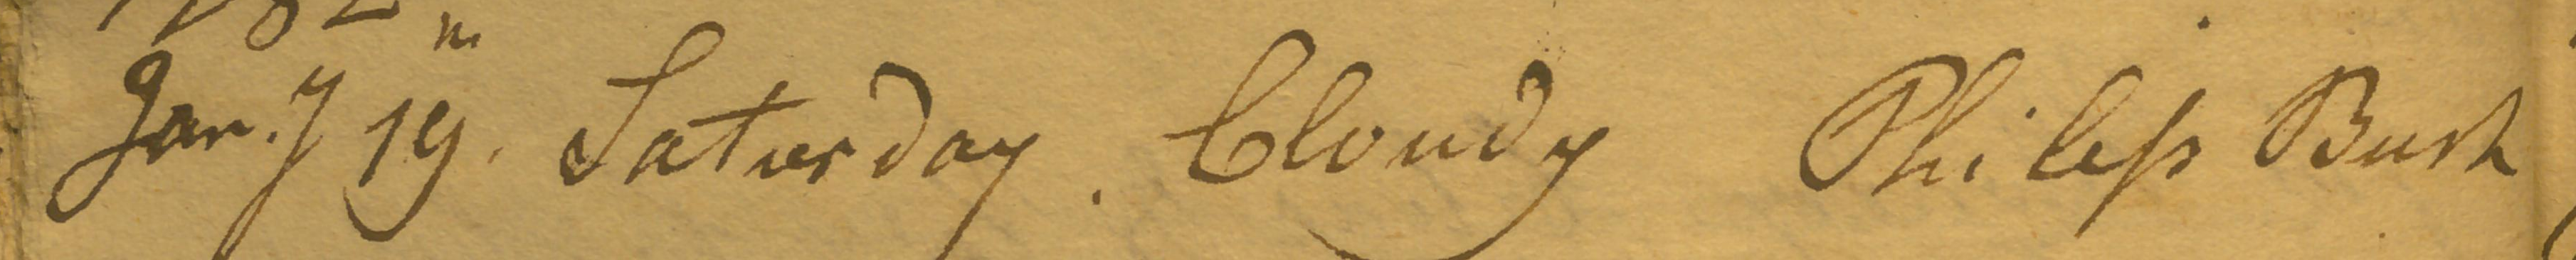Jan^y. 19^th. Saturday Cloudy Philip Bush
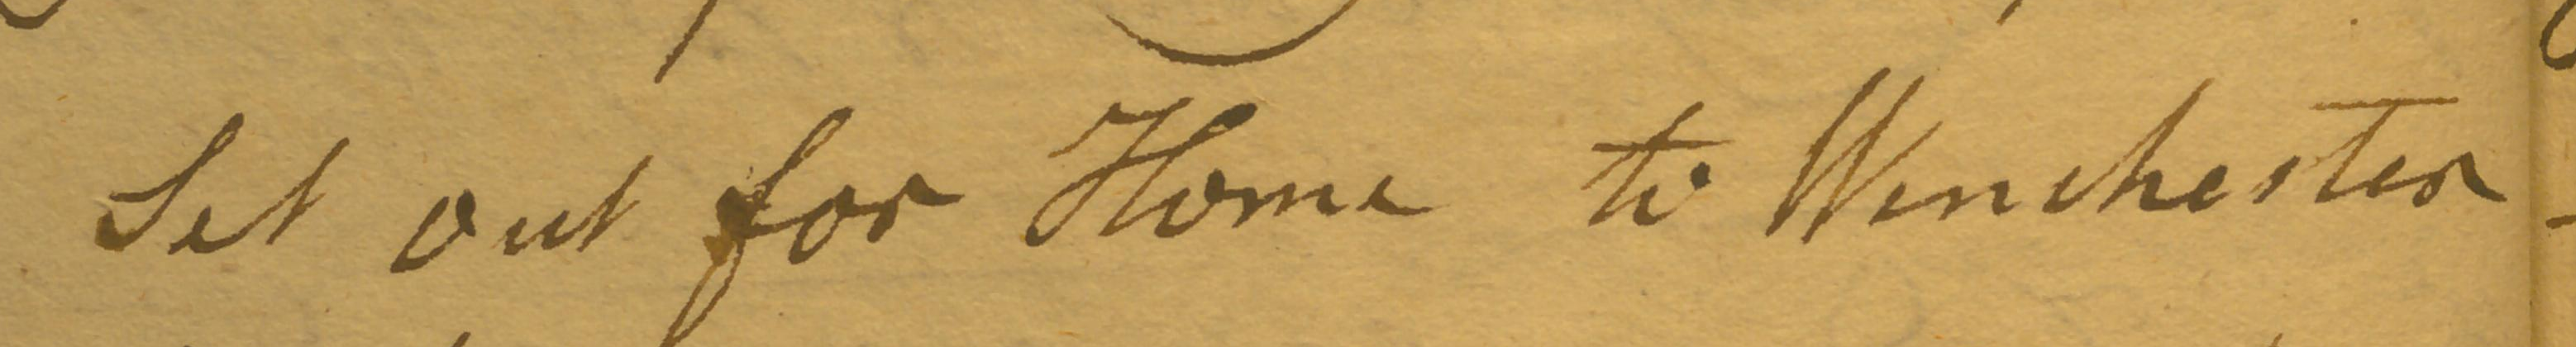Set out for Home to Winchester
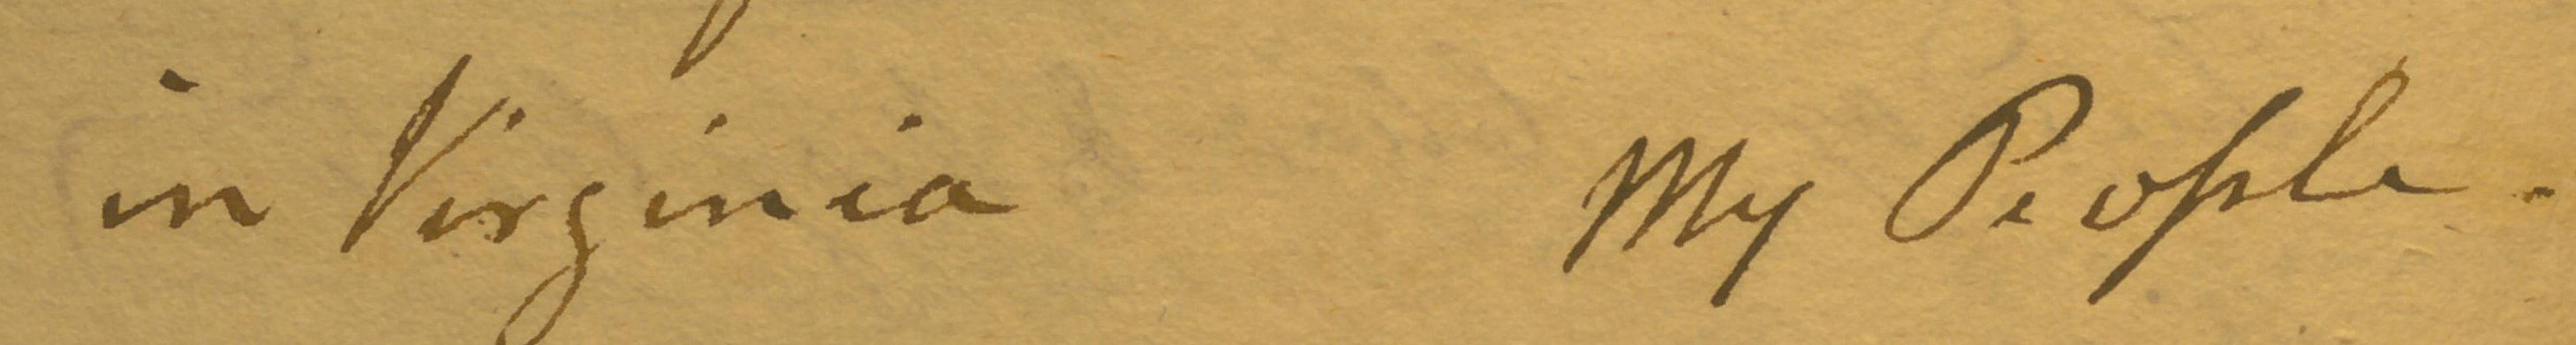in Virginia My People
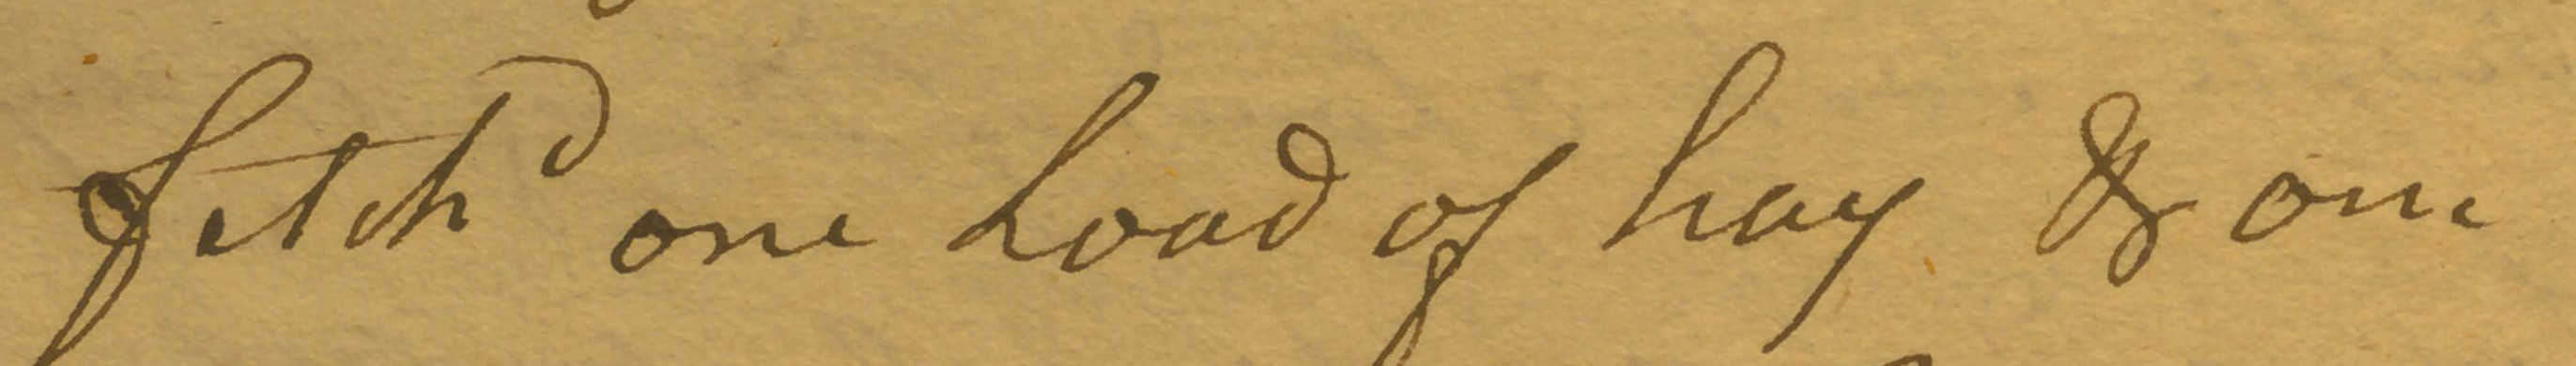fetch^d one Load of hay & one
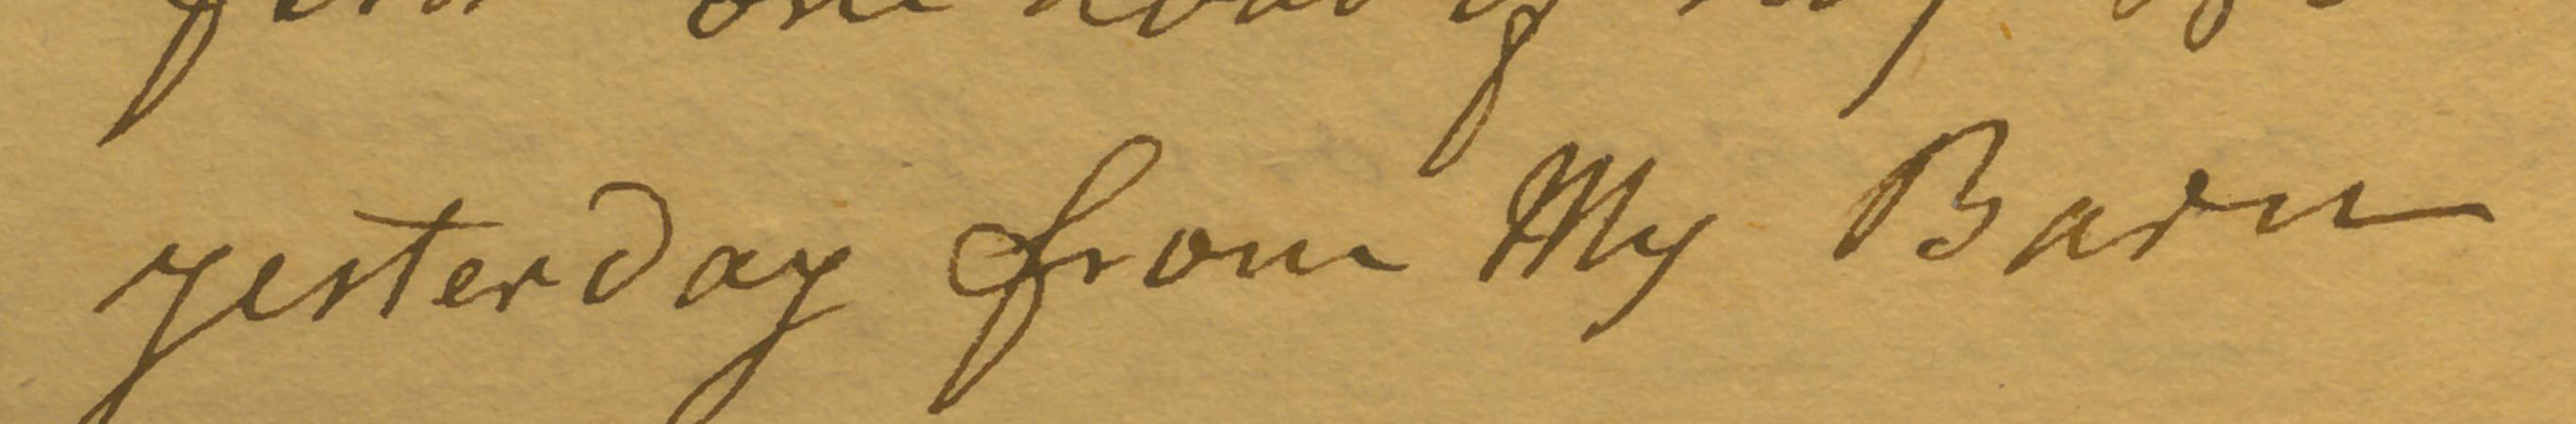yesterday from My Barn
